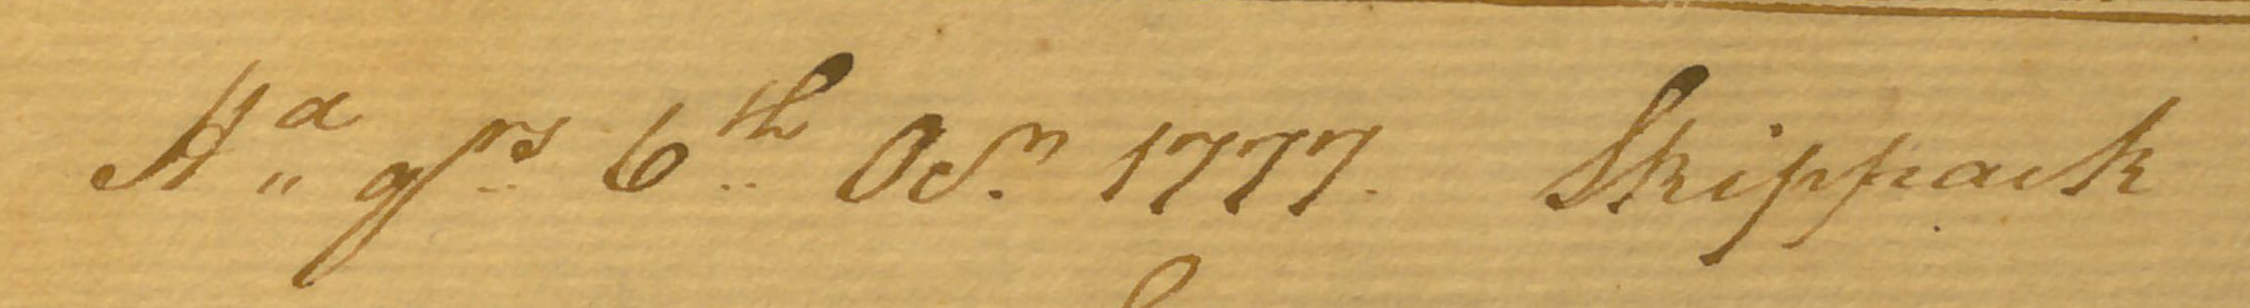H^d. q^rs. 6^th Oc^r. 1777. Skippack
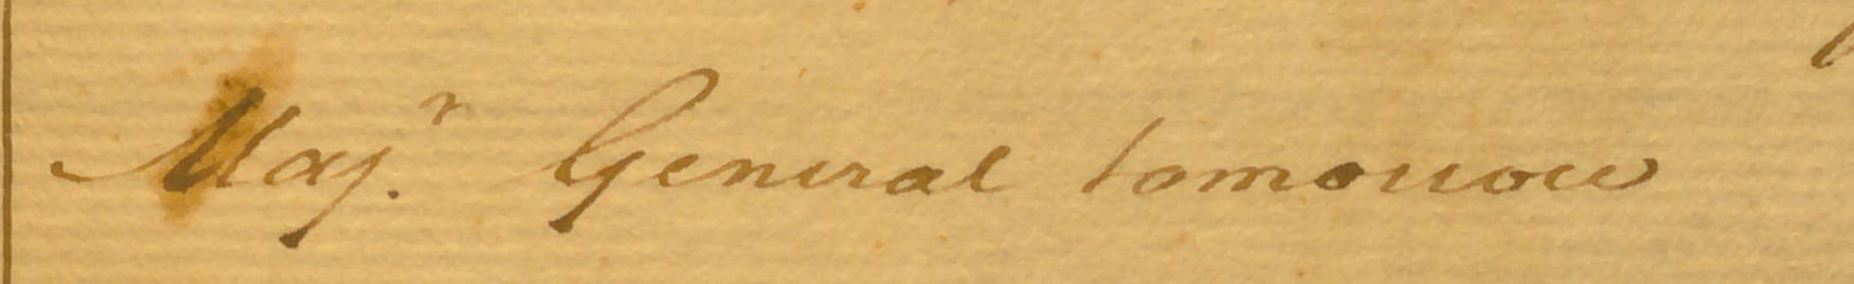Maj^r. General tomorrow
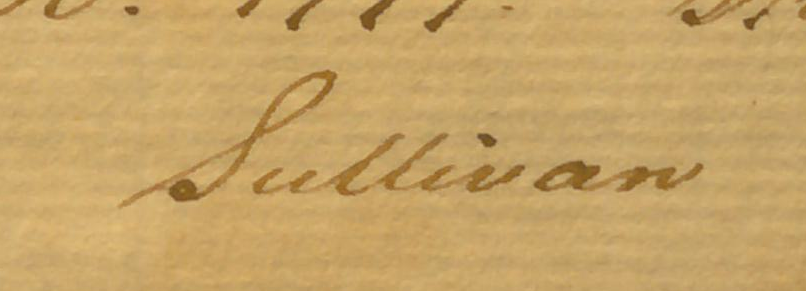Sullivan
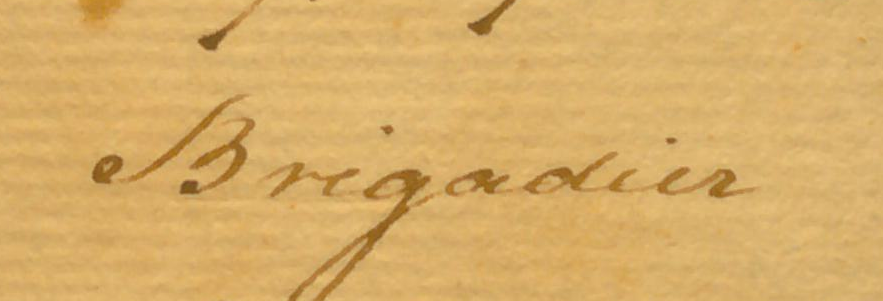Brigadier
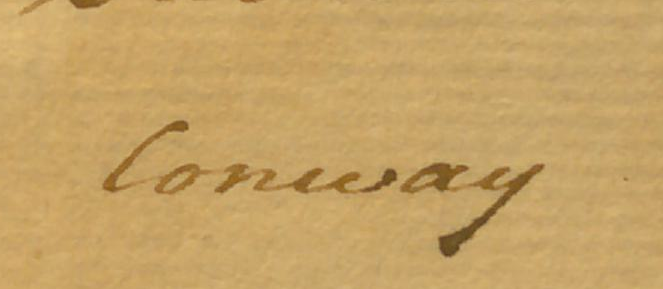Conway
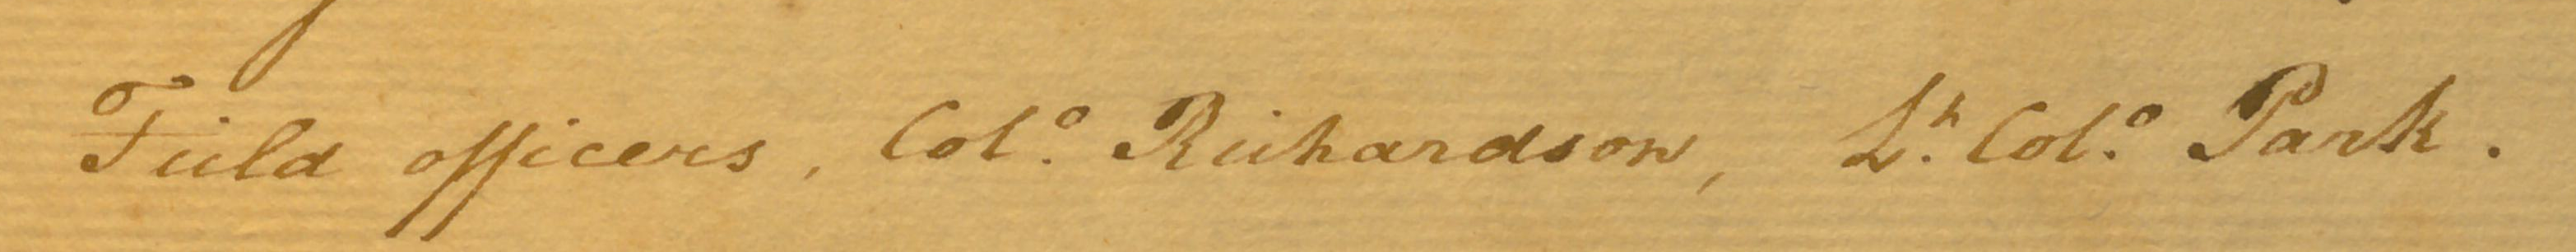Field officers. Col^o. Richardson, L^t. Col^o. Park.
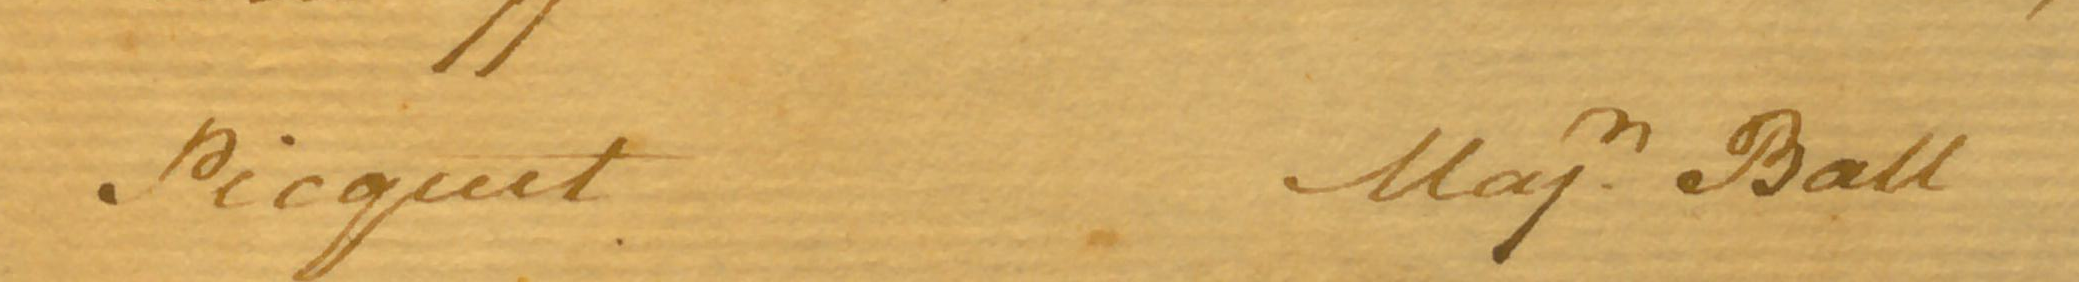Picquet Maj^r. Ball
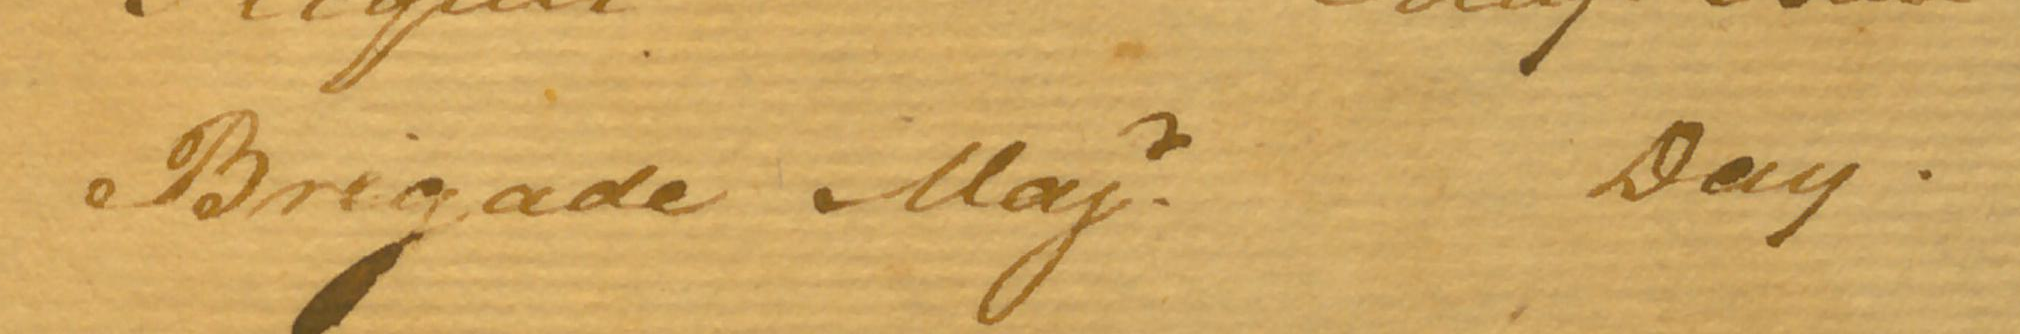Brigade Maj^r. Day.
